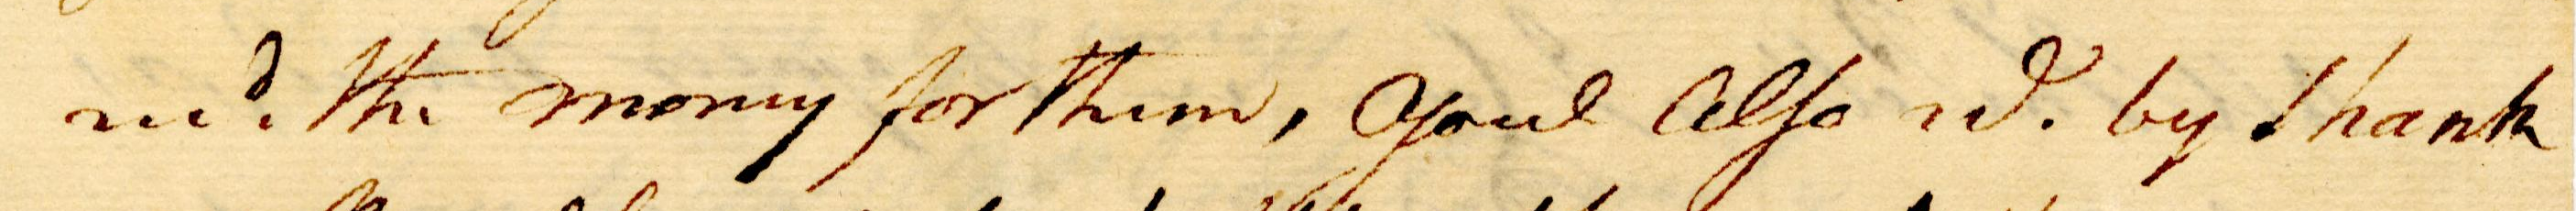rec^d. the money for them, youl Also re^e. by Shank
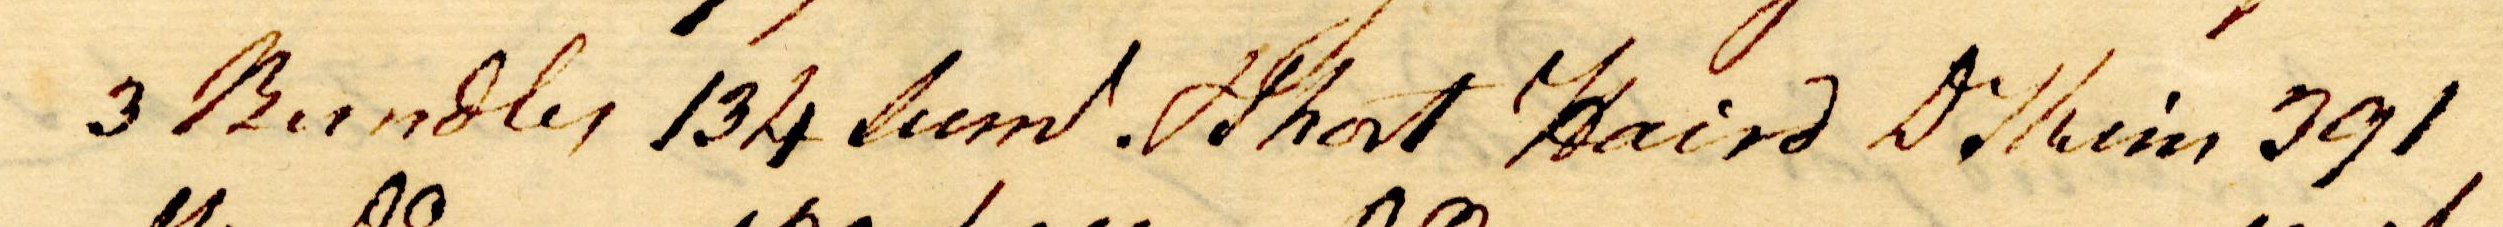3 Bundles 134 Sum^r. & short Haird D^r Skin 39s
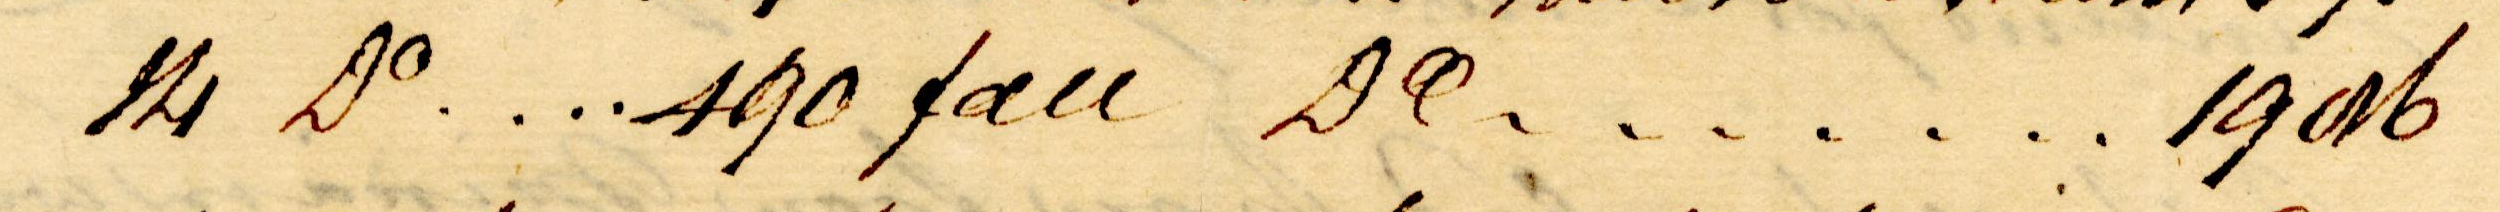14 D^o.... 490 fall D^o..... 1906
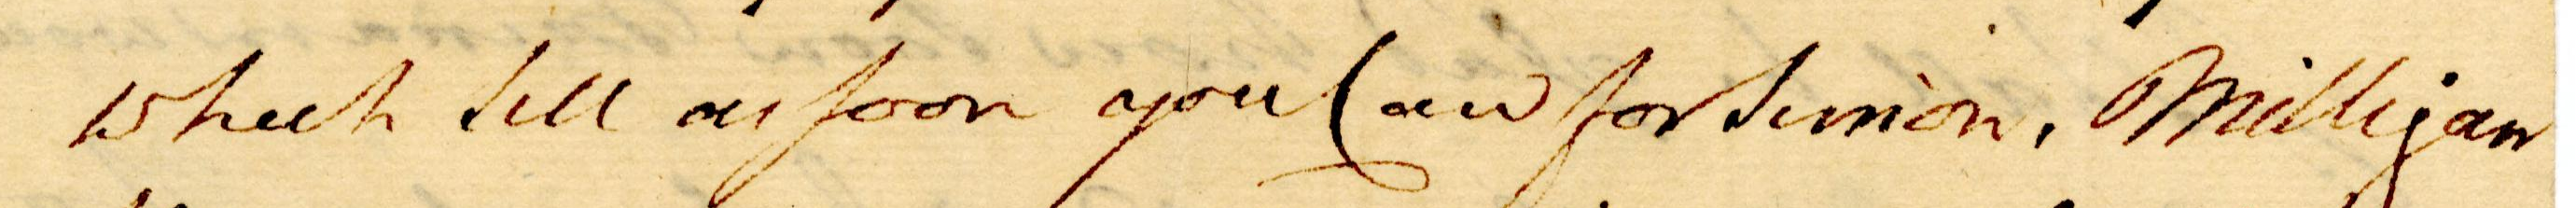whech Sell as soon you Can for Simon, Milligan
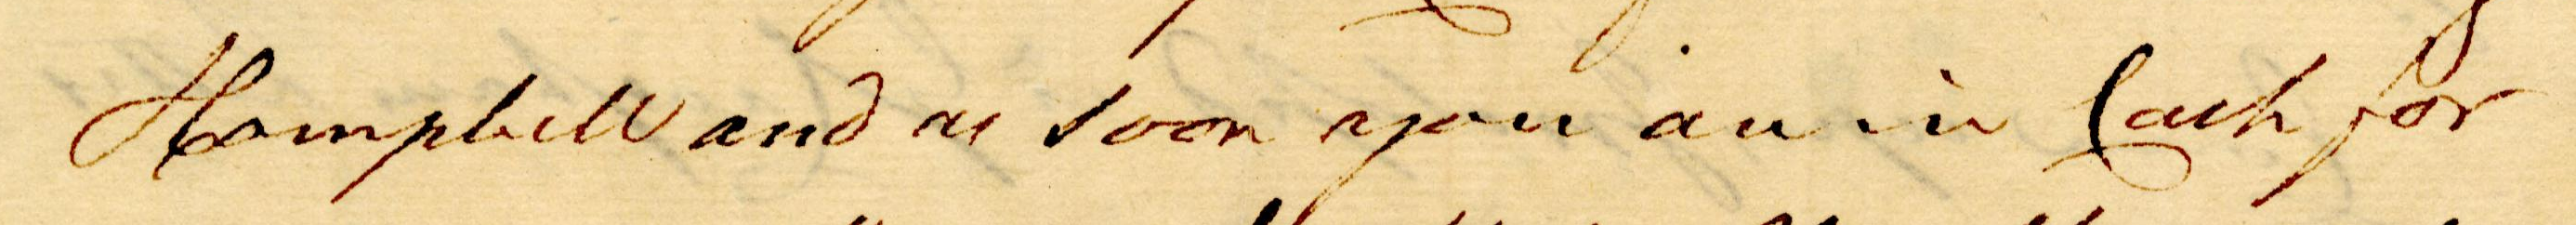& Campbell and as soon you are in Cash for
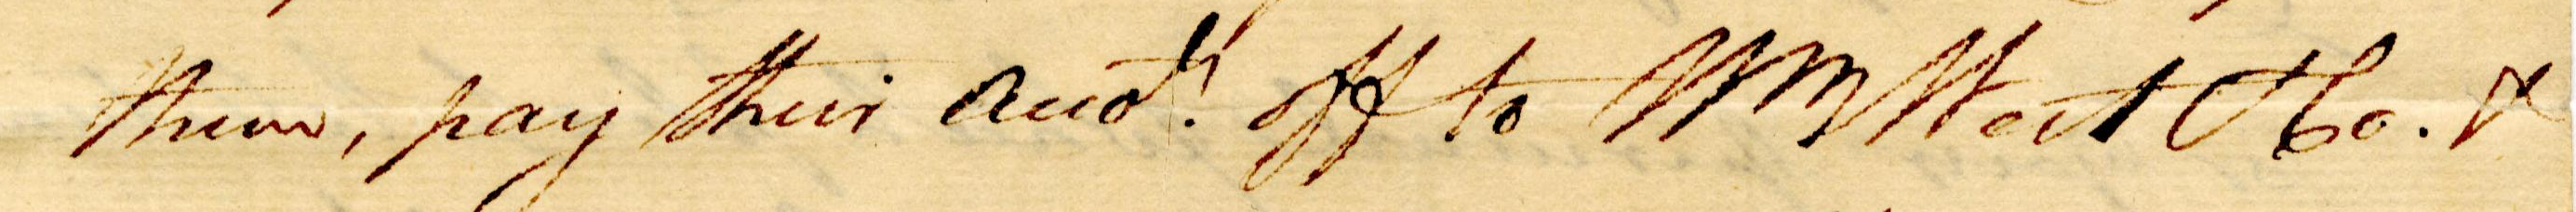them, pay their acco^t. off to W^m West &Ca. &
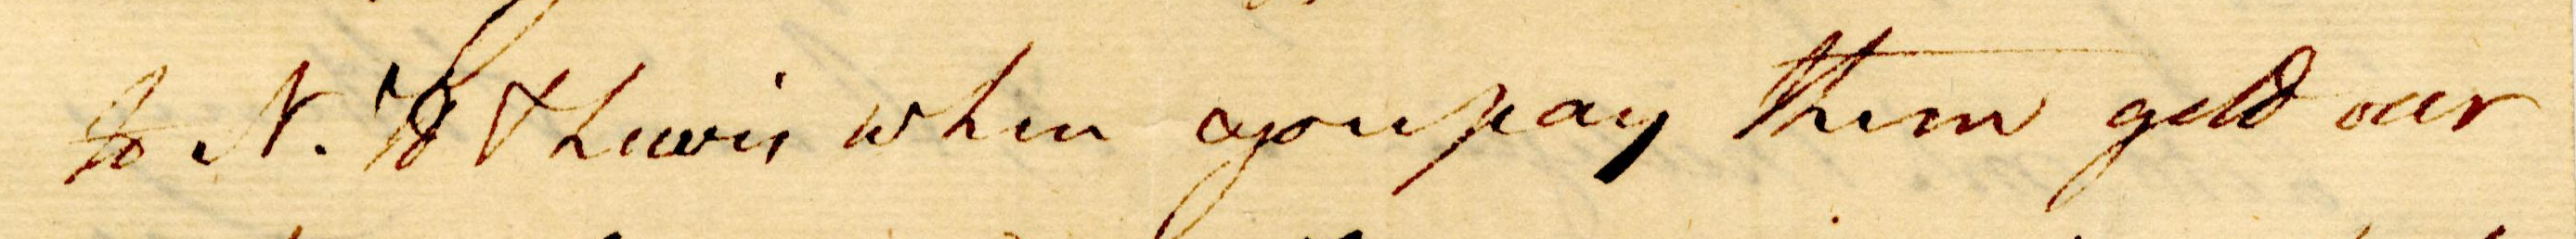to N. J. & H Lewis when you pay them getd our
